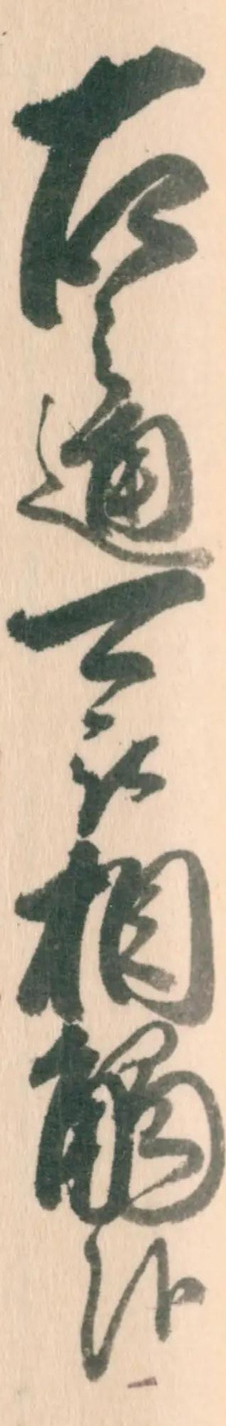右之通可被相触候

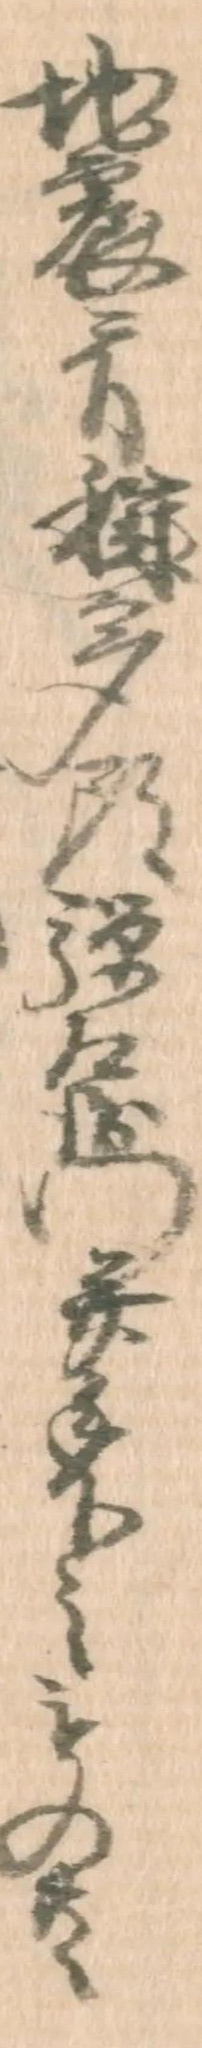│地震ニ付穢多頭弾左衛門幷手下之もの共へ
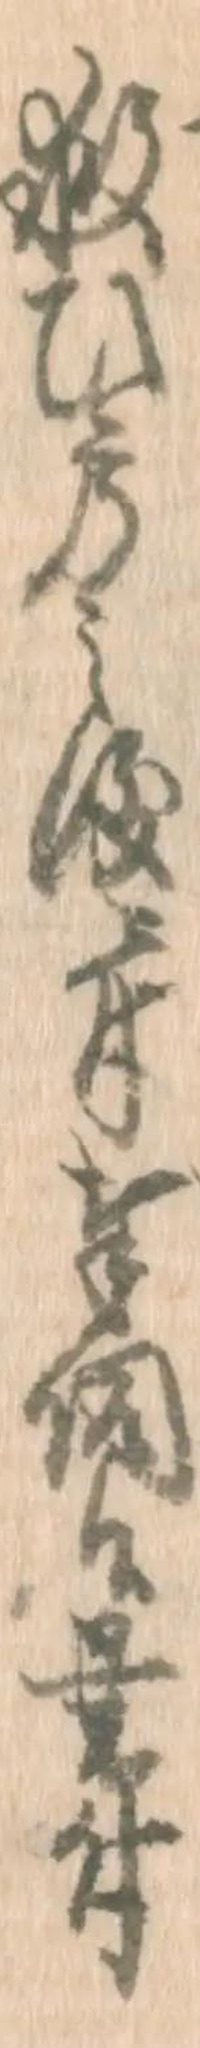│救ひ方之儀ニ付奉伺候書付
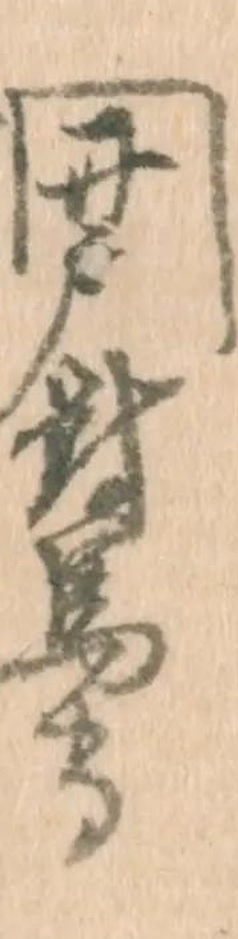│[井戸対馬守
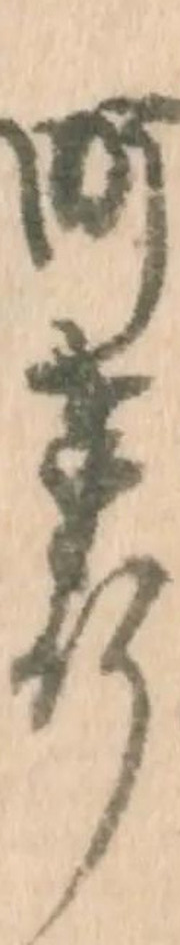│町奉行
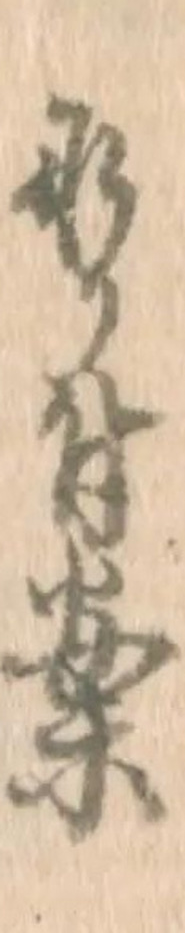承り付案
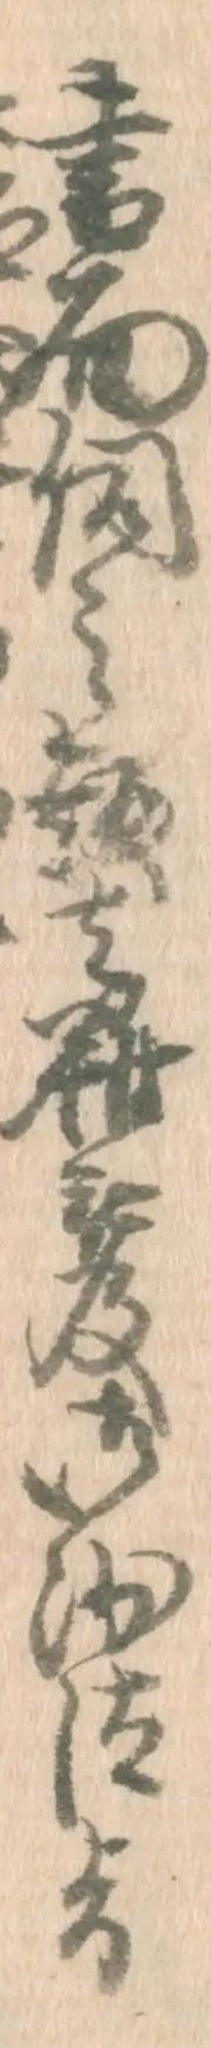書面伺之趣は難被及御沙汰旨
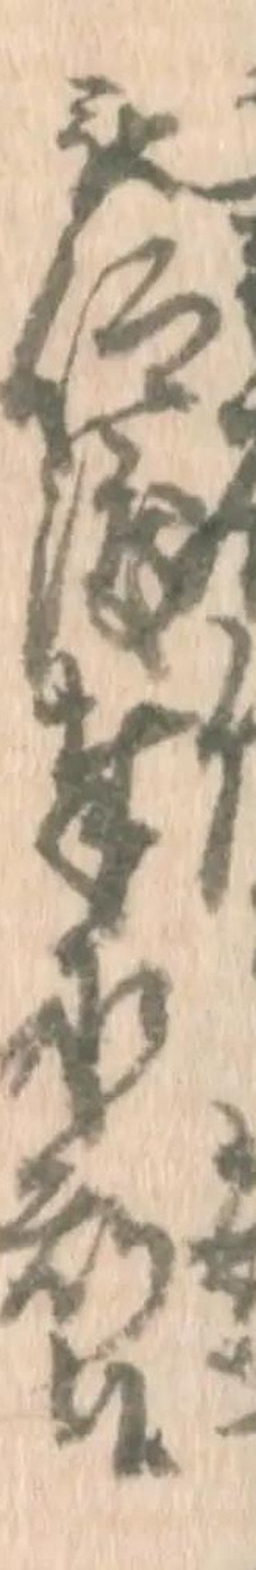被仰渡奉承知候
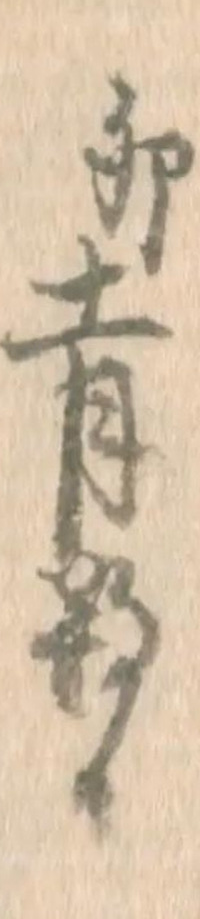卯十一月朔日

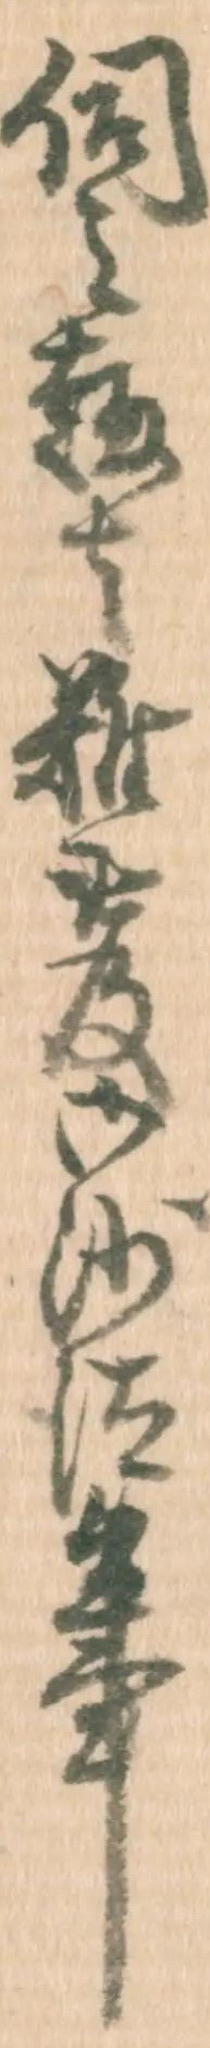伺之趣は難被及御沙汰候事
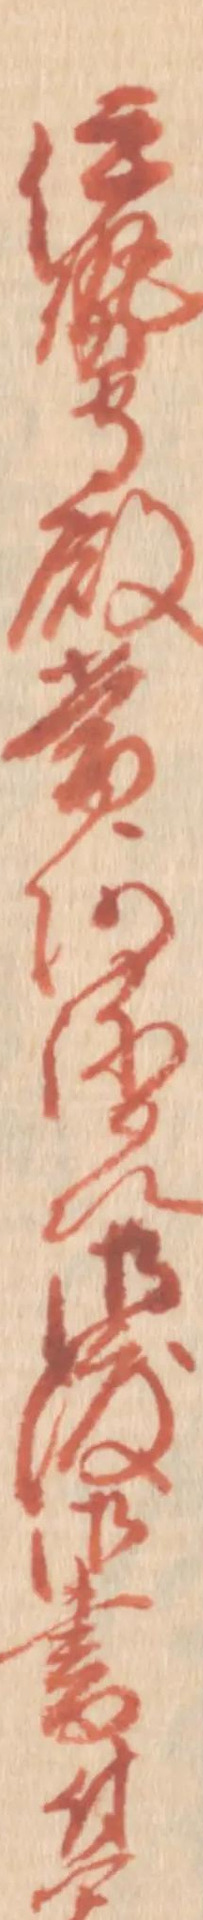│「伊勢守殿常阿弥ヲ以御渡御書付写し」
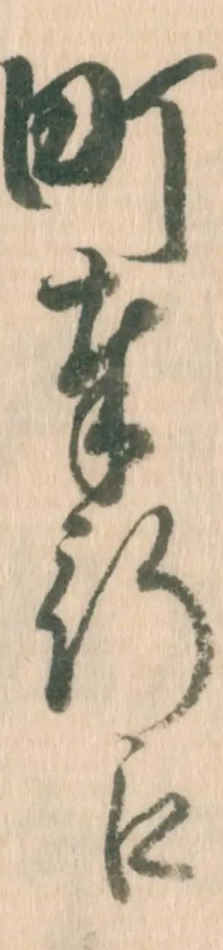│町奉行え
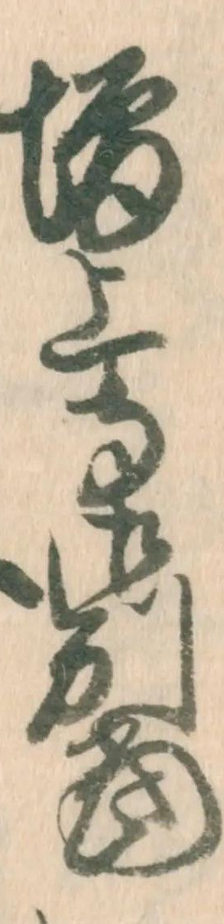増上寺御別当
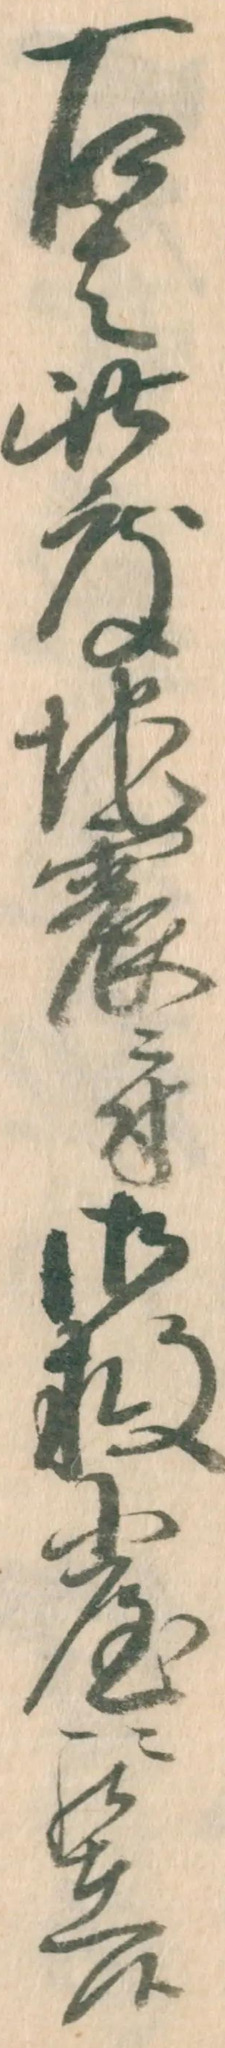右は此度地震ニ付御救小屋ニ罷在候

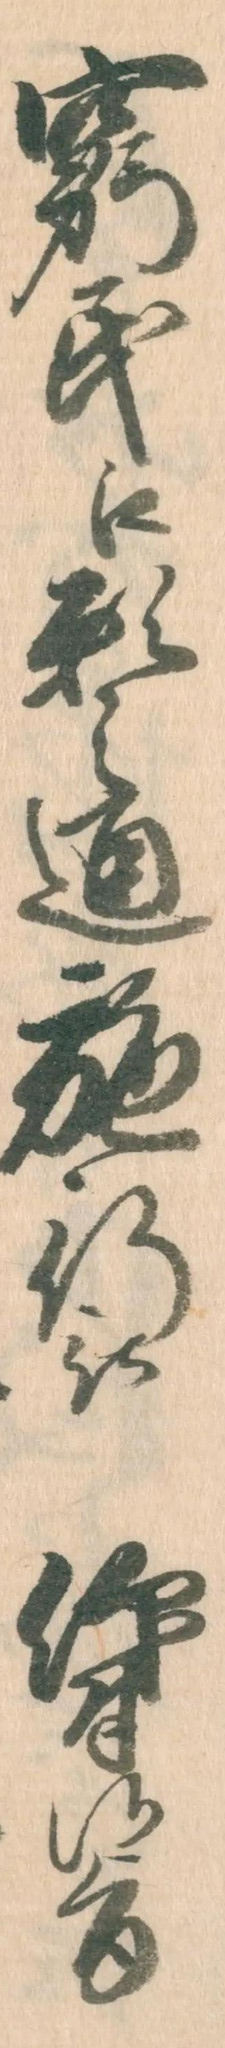窮民え願之通施行被仰付候旨
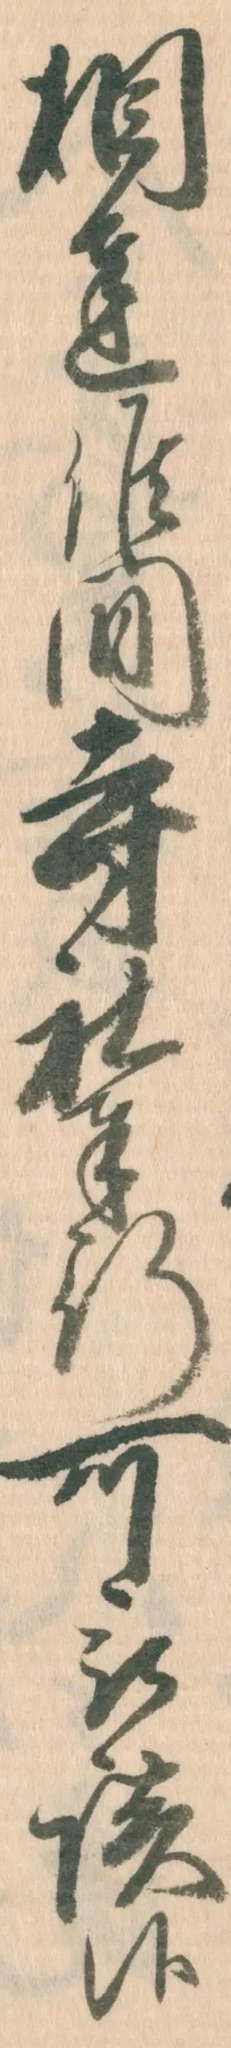相達候間寺社奉行可被談候
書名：地震災書留 2巻. [2] 内表紙に「地震一件　安政二卯年十月」とあり
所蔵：国立国会図書館 National Diet Library, JAPAN
